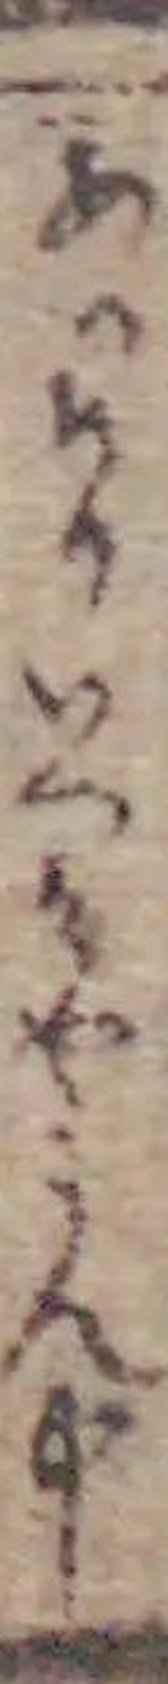ありけりいつそやうん中
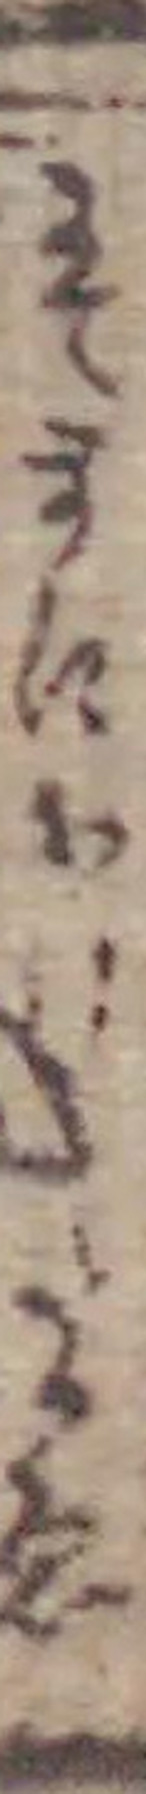にてまきあけたるゑ
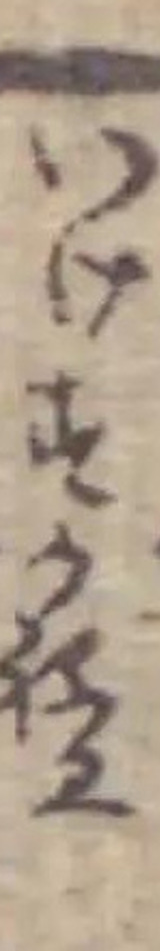いけすかねヱ
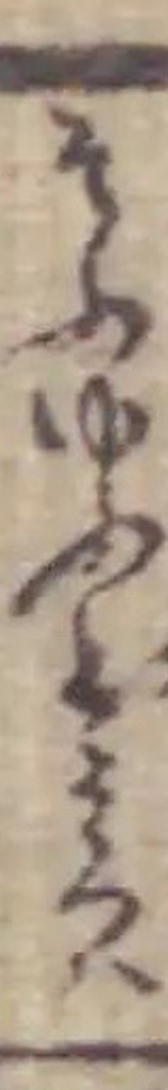そふゆふところは
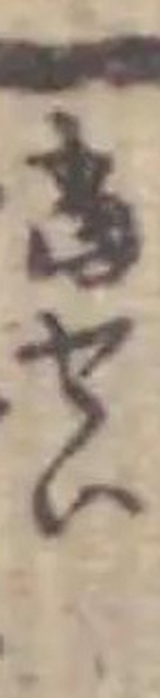当せい
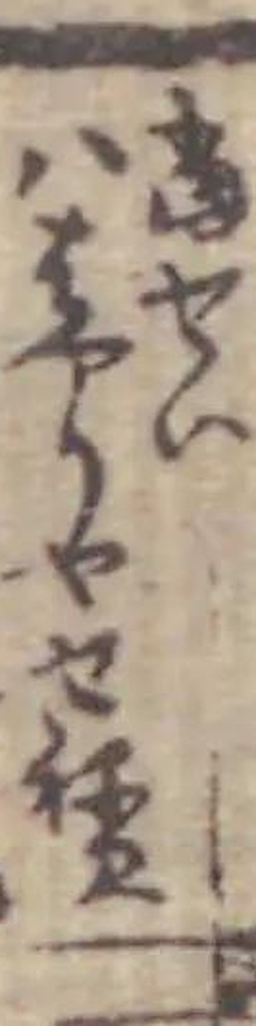ははやりやせねヱ
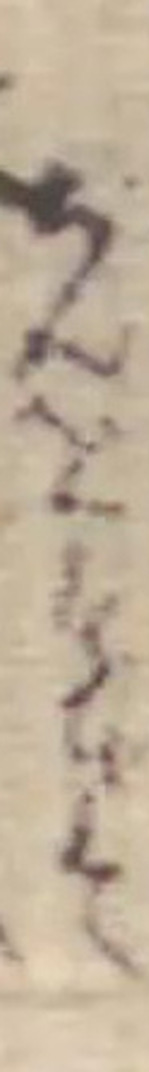ちんをすきて
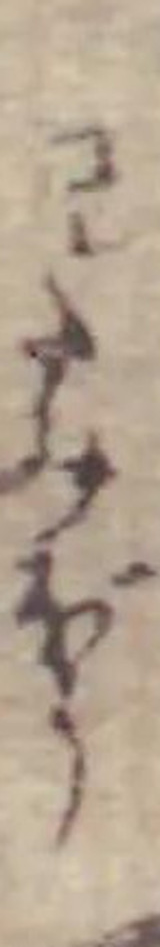コレたみぼう
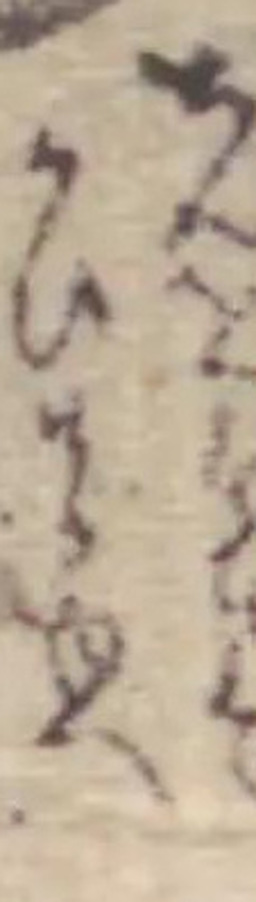かひけるゆへ
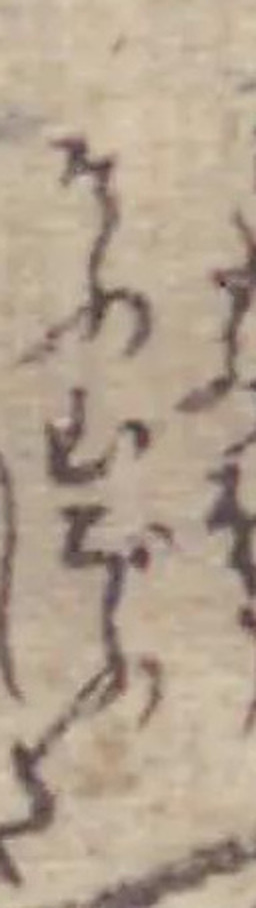そふむごふ
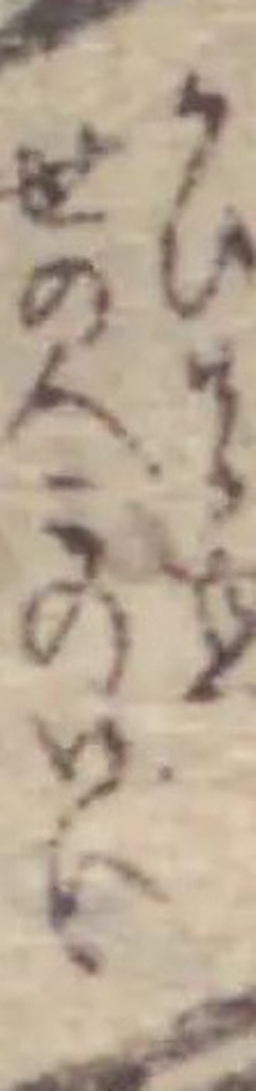世の人このげい
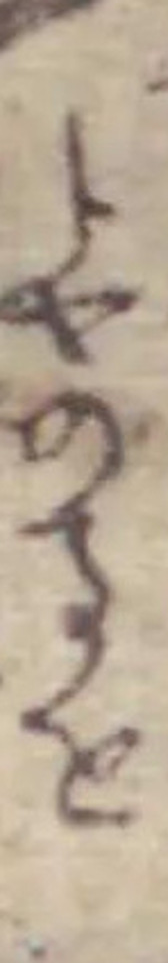しやの事を
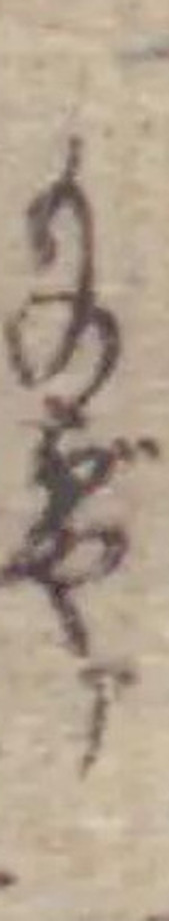ものじやァ
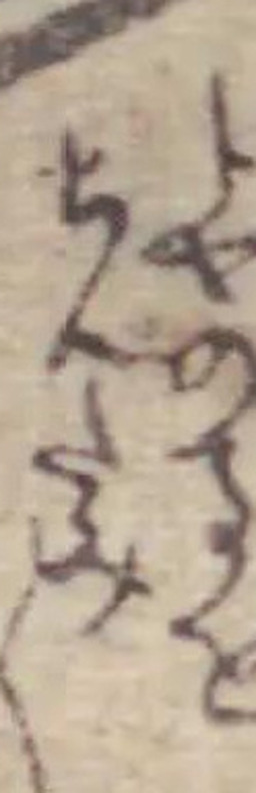ちんたみ
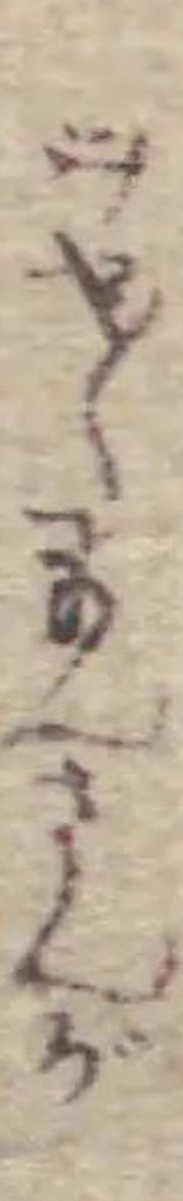をや〳〵まんさんが
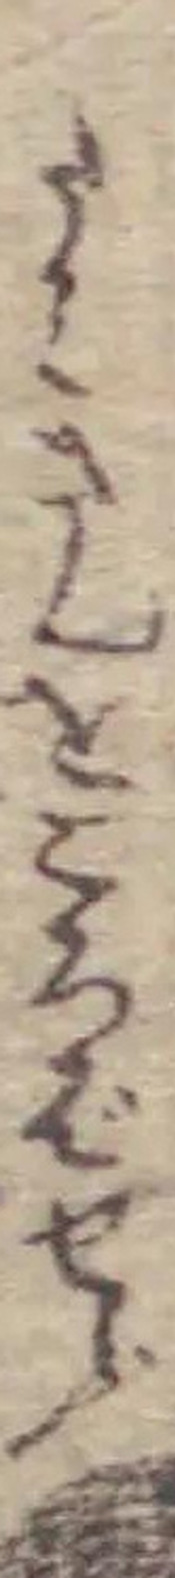たみさんをころばせふ
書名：通人為真似 2巻
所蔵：国立国会図書館 National Diet Library, JAPAN
